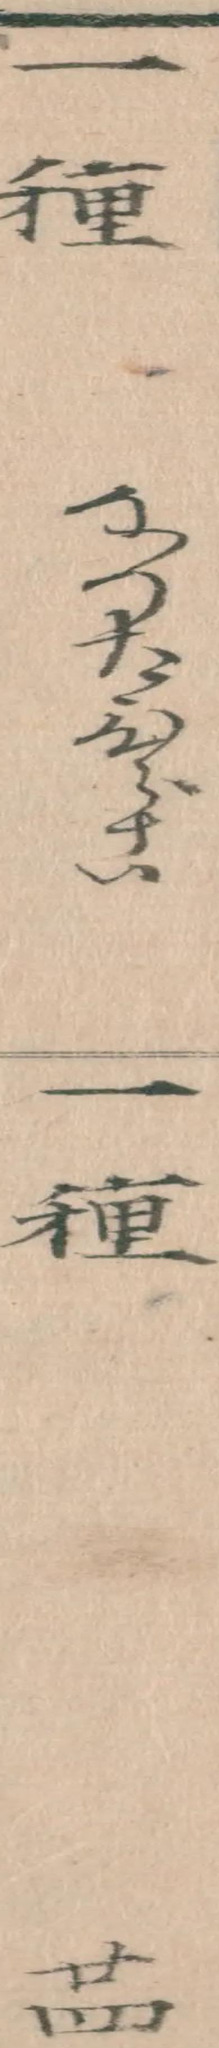一種なつたひらこ一種廿四

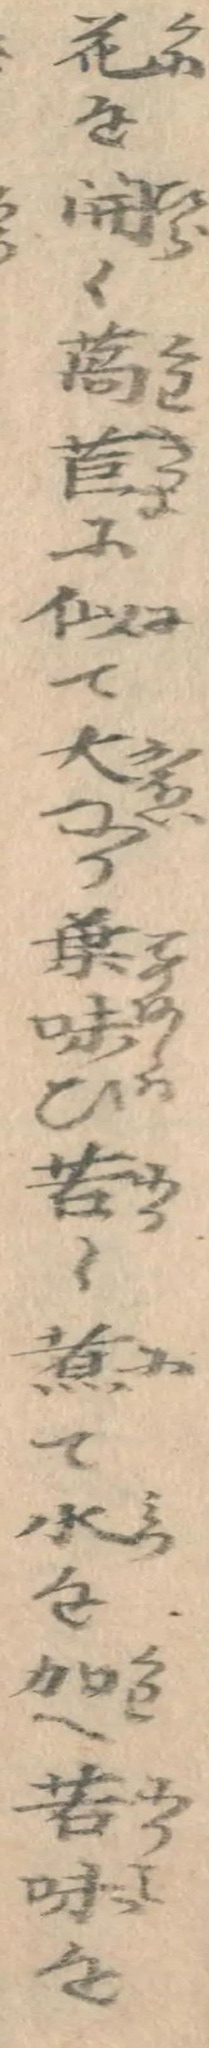花を開く窩苣に似て大なり葉味ひ苦し煮て水を加へ苦味を
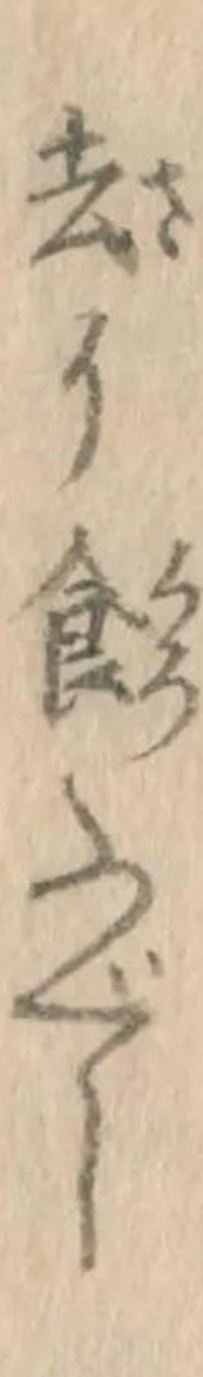去り食ふべし
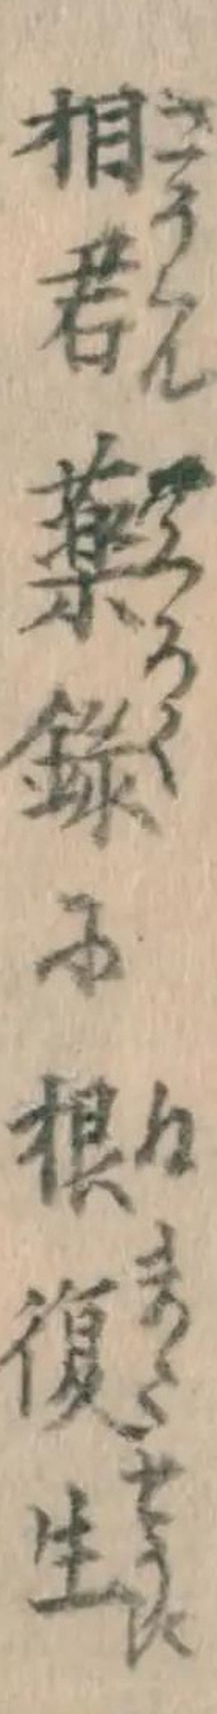相君薬録に根復生
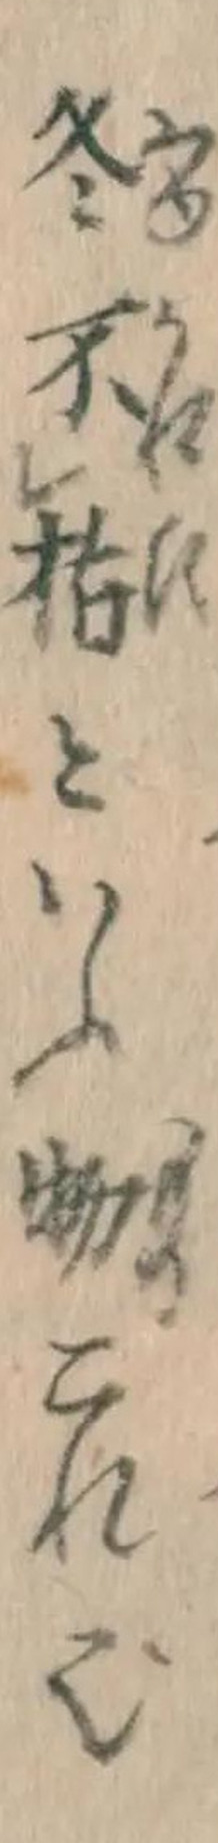冬不枯といふ物これ也
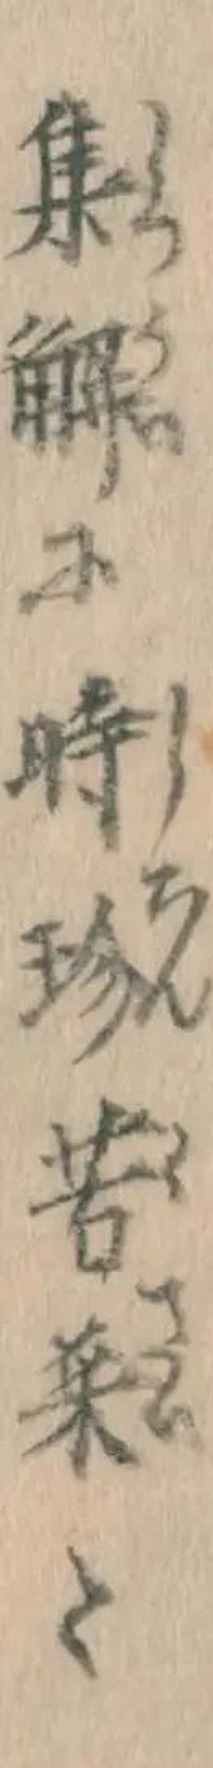集解に時珍苦菜と
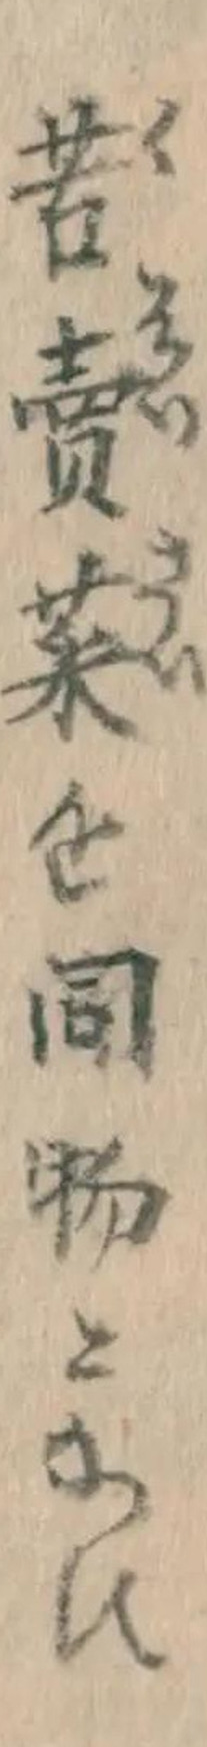苦売菜を同物となす
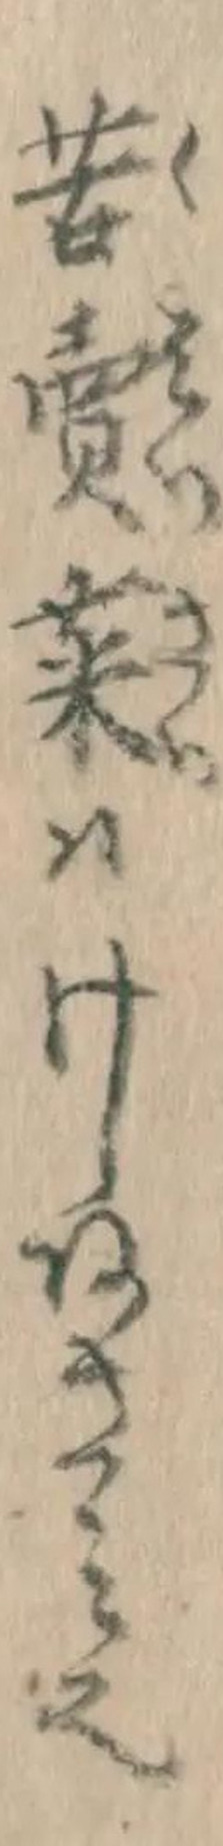苦売菜はけしあさみ也
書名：本草図譜. 巻49-51
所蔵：国立国会図書館 National Diet Library, JAPAN
